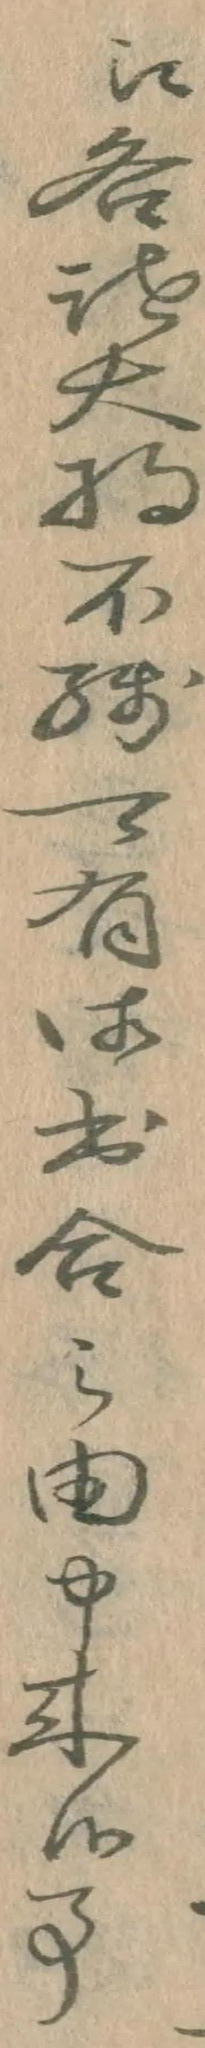江各諸大将不残可有御出合之由申来候事
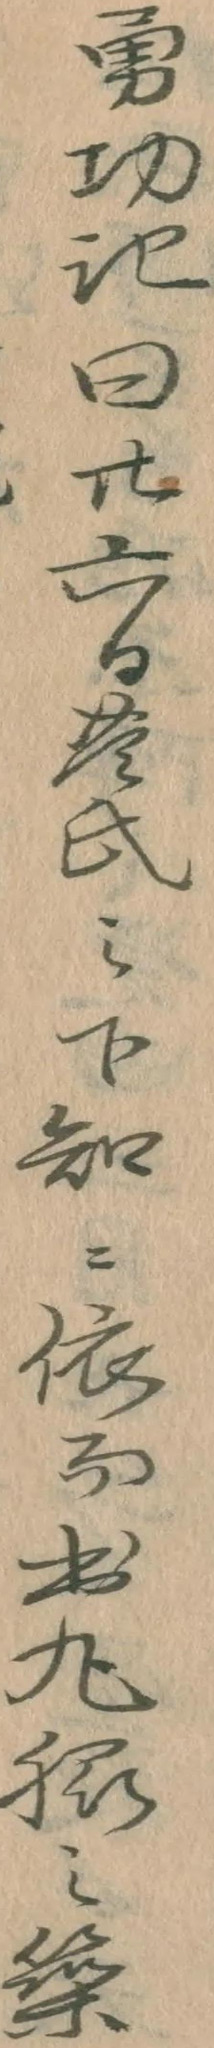勇功記曰廿六日豊氏之下知に依而出丸脇之築
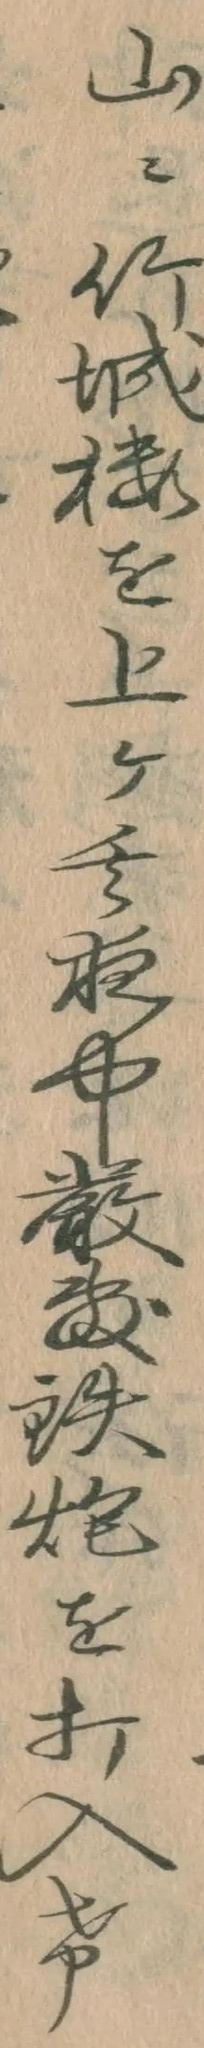山に竹城樓を上け其夜中厳敷鉄炮を打入希
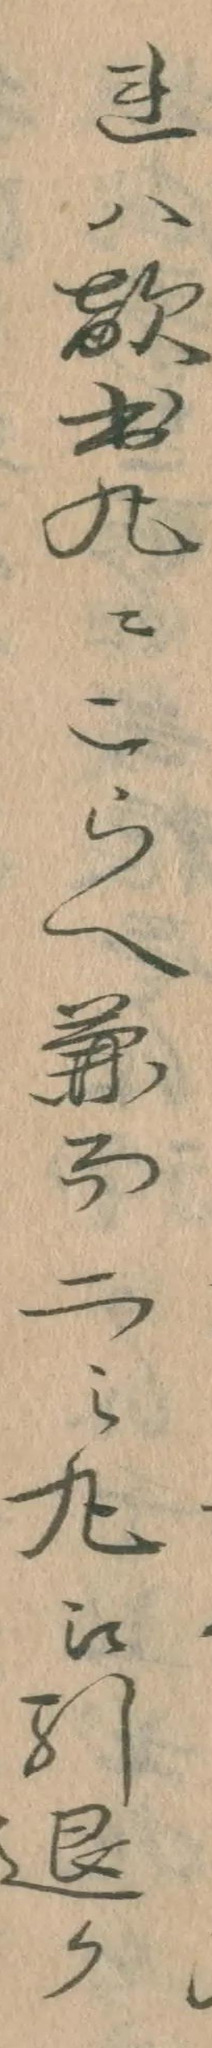連は敵出丸にこらへ兼而二之丸江引退く
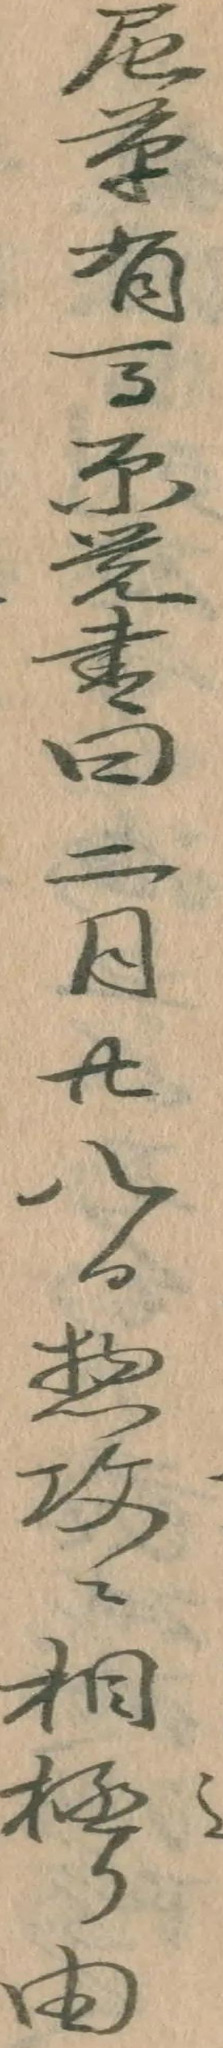尼草有馬原覚書曰二月廿八日惣攻に相極り由
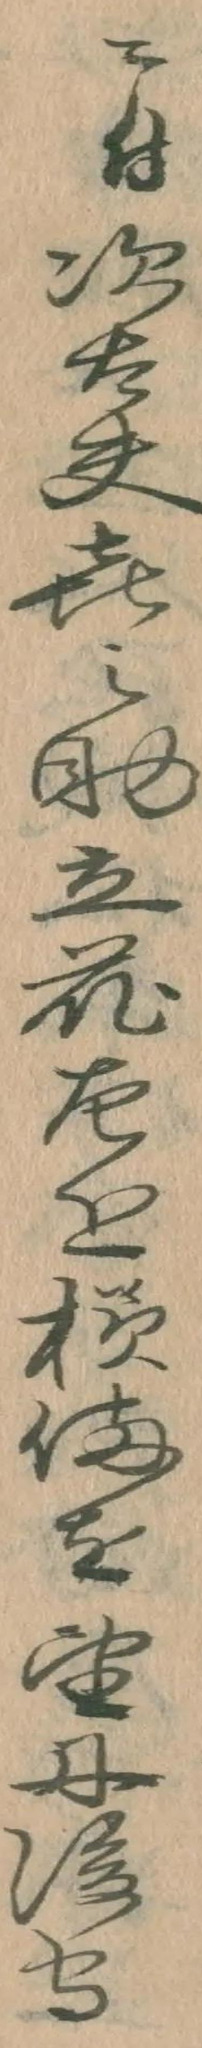に付次太夫喜之助立花左近様備を望丹後守
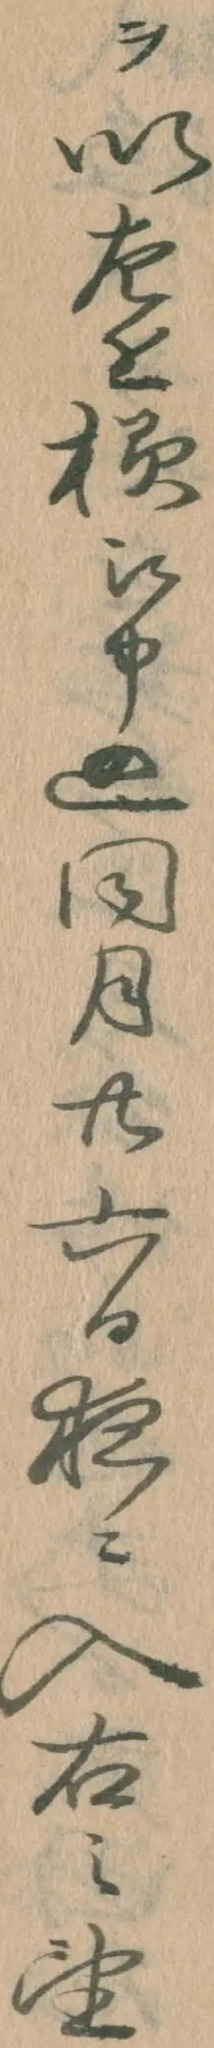を以左近様被申込同月廿六日夜に入右之望
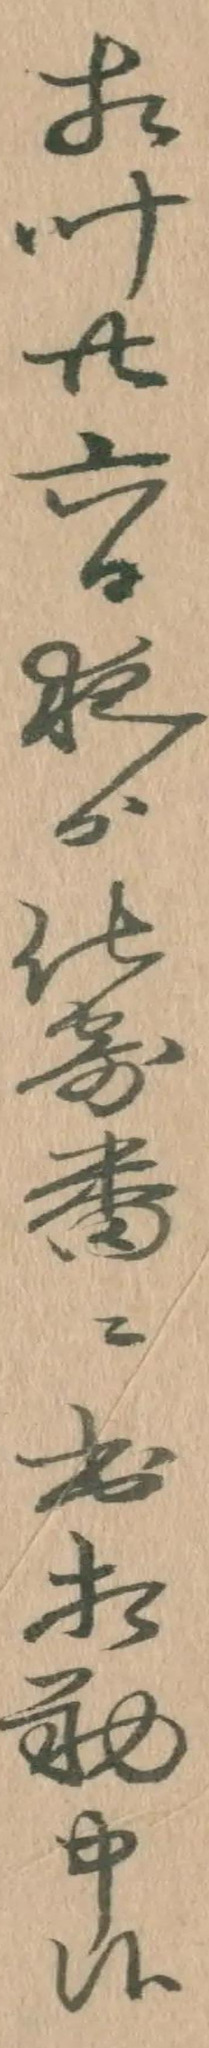相叶廿六日夜ゟ仕寄番に出相勤申候

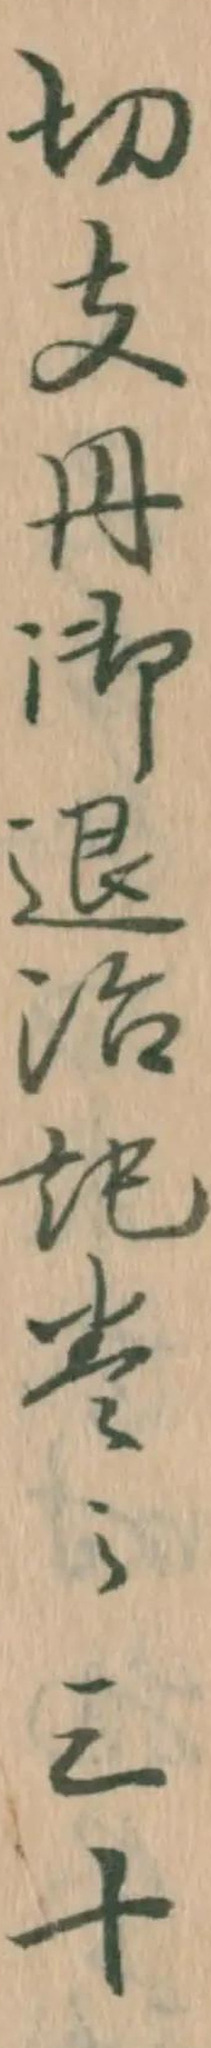切支丹御退治記巻之三十
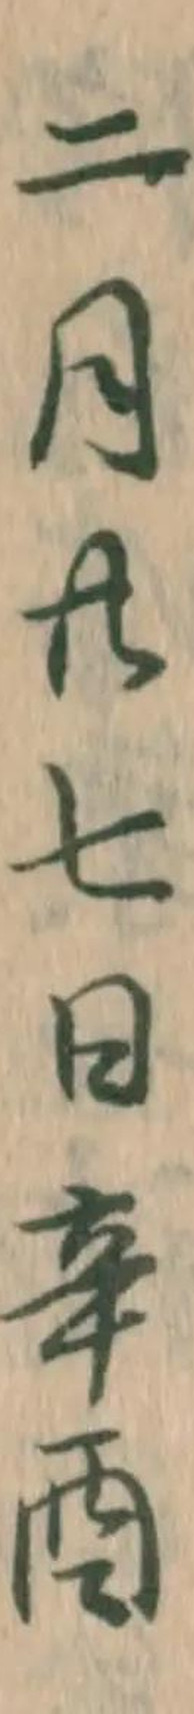二月廿七日辛酉
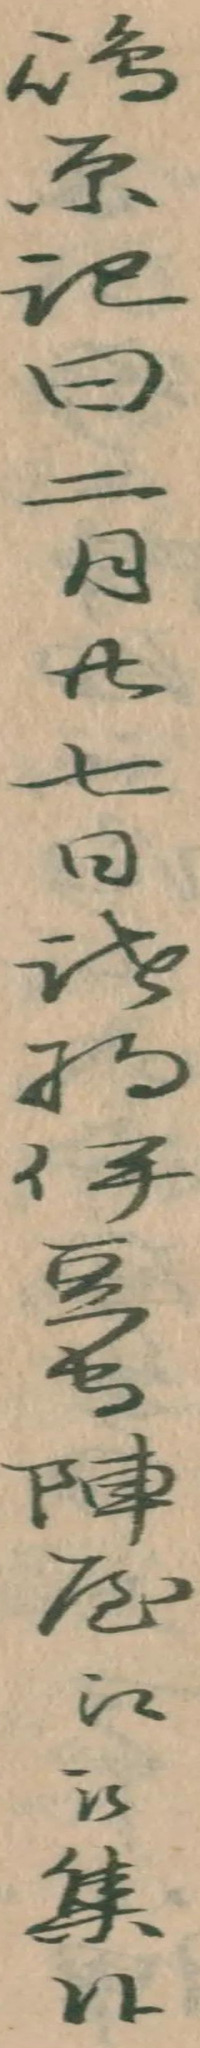島原記曰二月廿七日諸将伊豆守陣屋江被集候
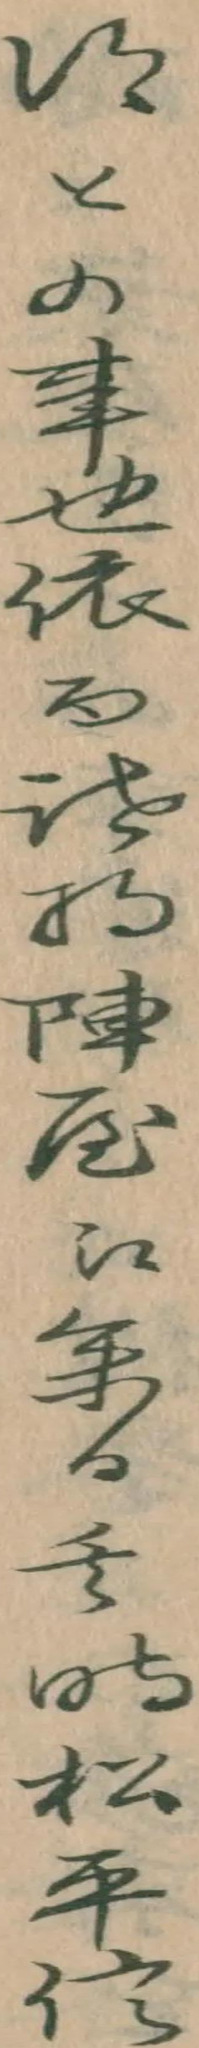得との事也依而諸将陣屋江参る其時松平信
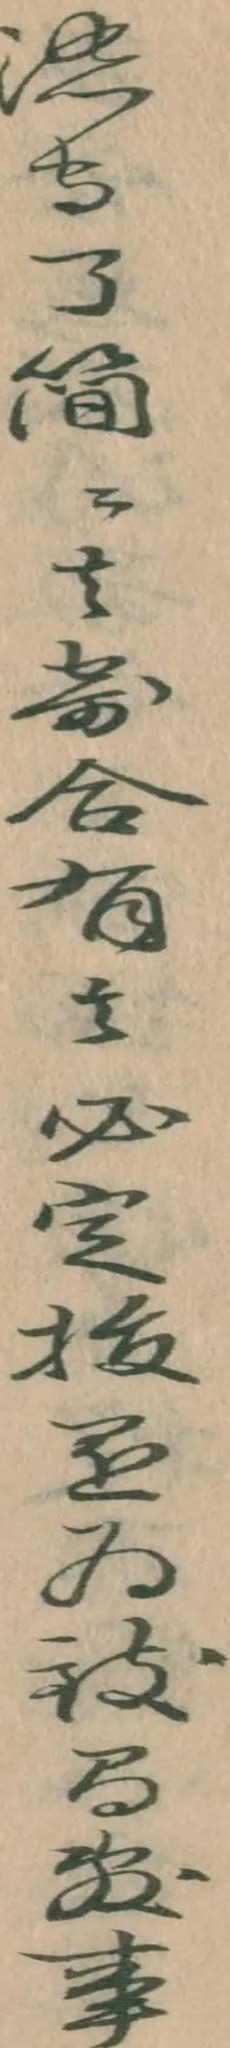濃守了簡に者寄合有者必定抜懸ゐ致間敷事
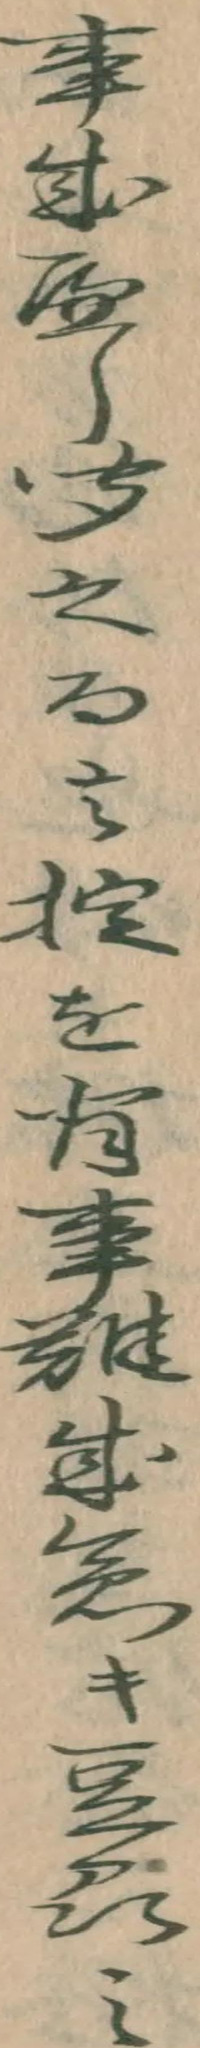事成扁し聞之而者掟を背事難成急き豆州之
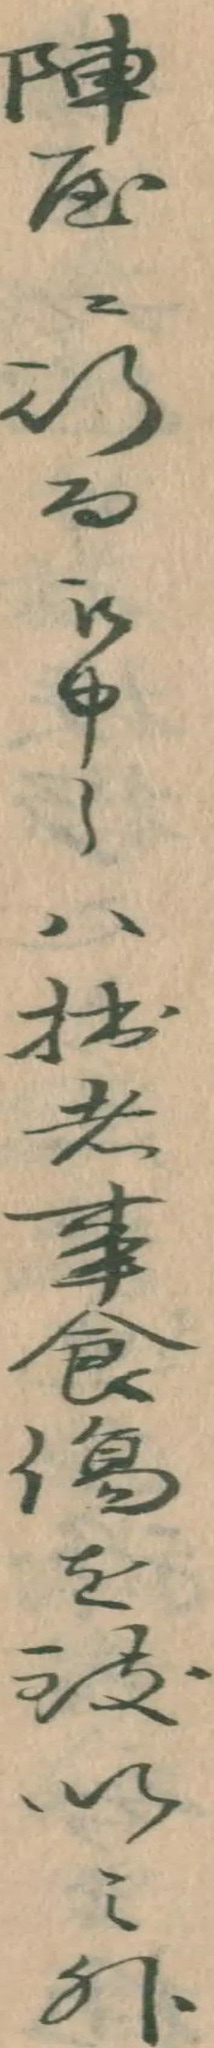陣屋に行而被申しは拙者事食傷を致以之外
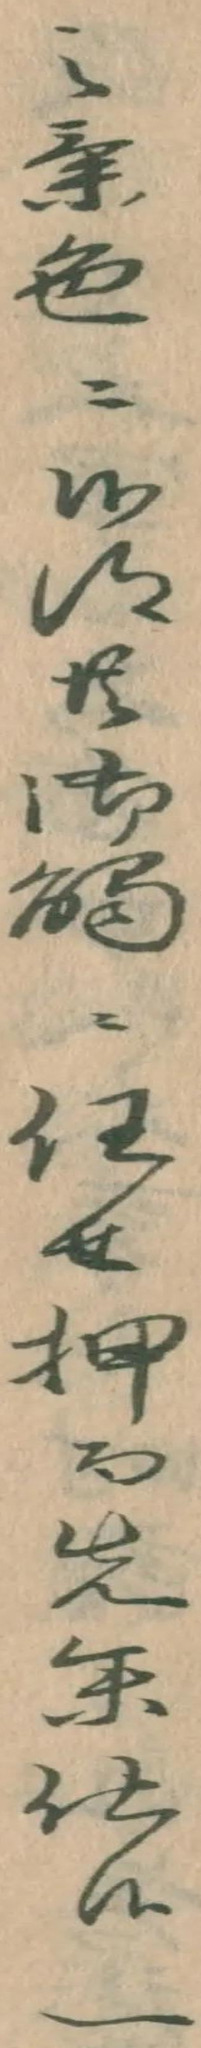之気色に候得共御触に任せ押而先参仕候一
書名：切支丹御退治記 49巻. [7]
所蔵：国立国会図書館 National Diet Library, JAPAN
